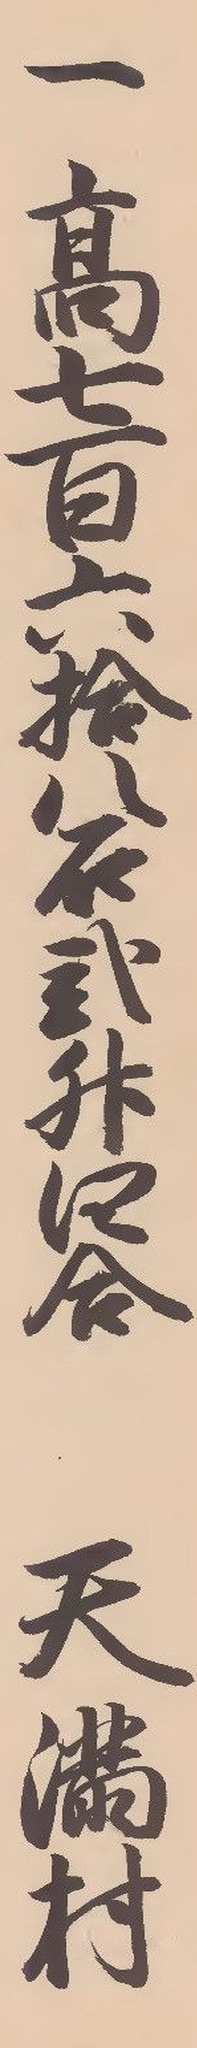一高七百六拾八石弐升四合天満村
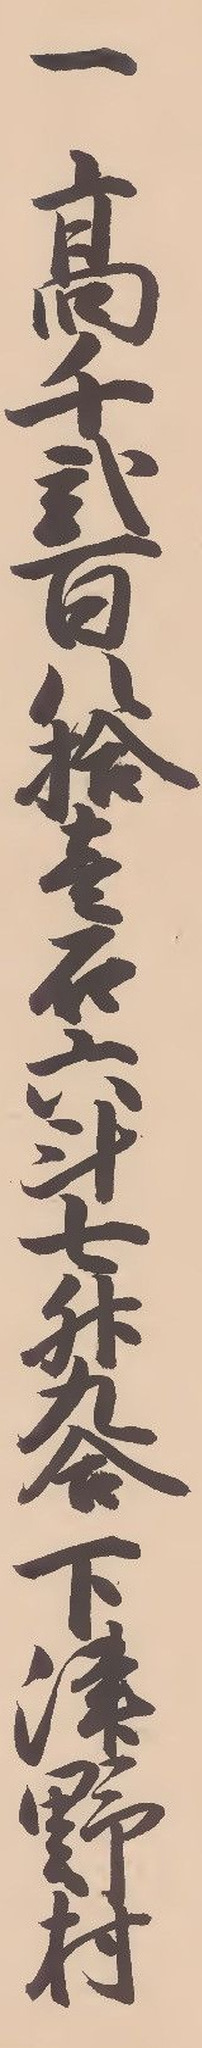一高千弐百八拾壱石六斗七升九合下津野村
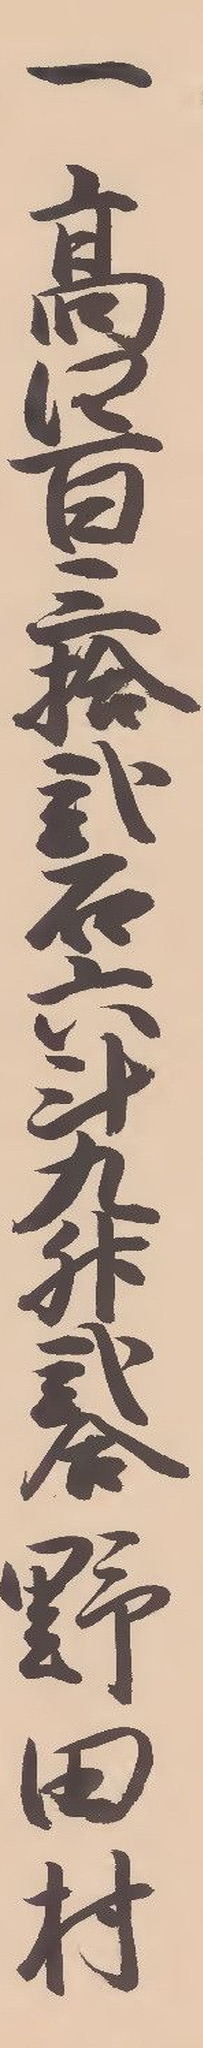一高四百三拾弐石六斗九升弐合野田村
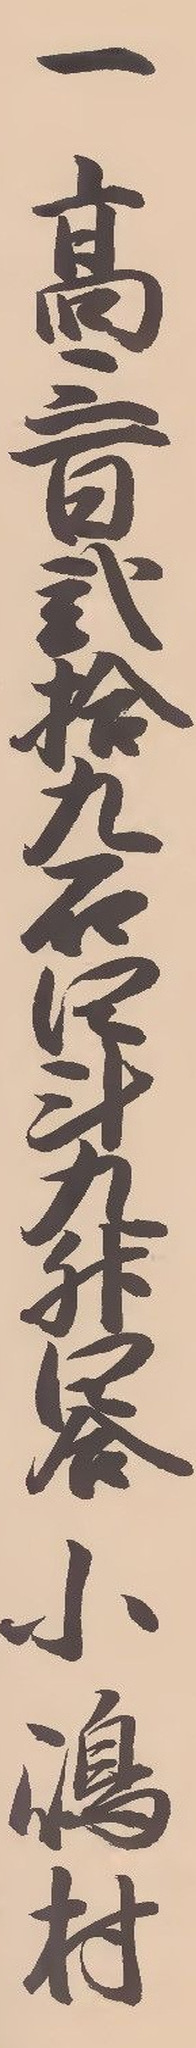一高三百弐拾九石四斗九升四合小島村
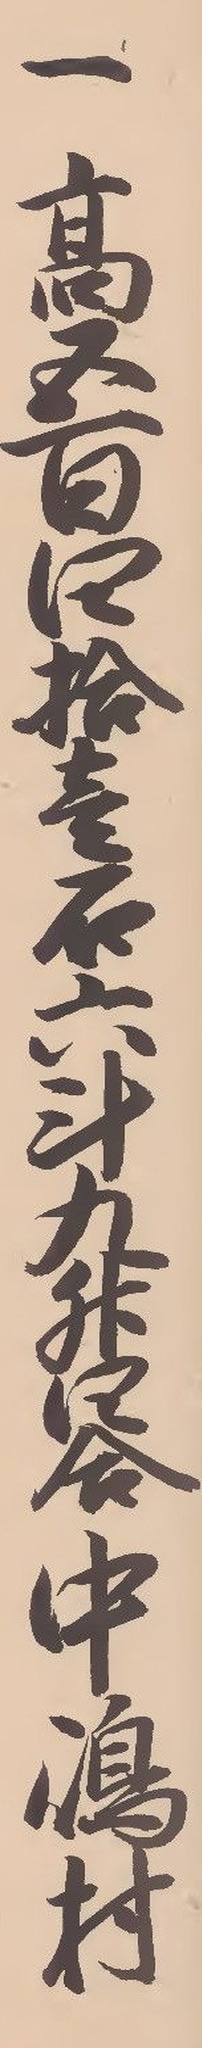一高五百四拾壱石六斗九升四合中島村
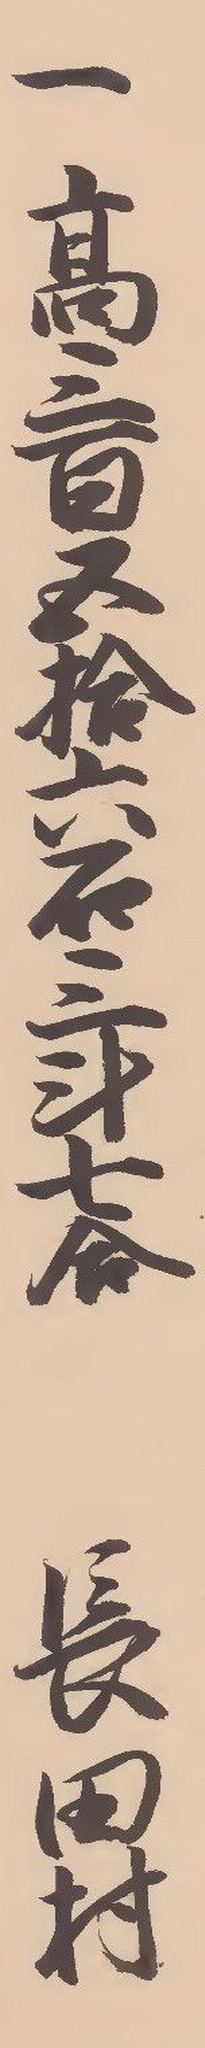一高三百五拾六石三斗七合長田村
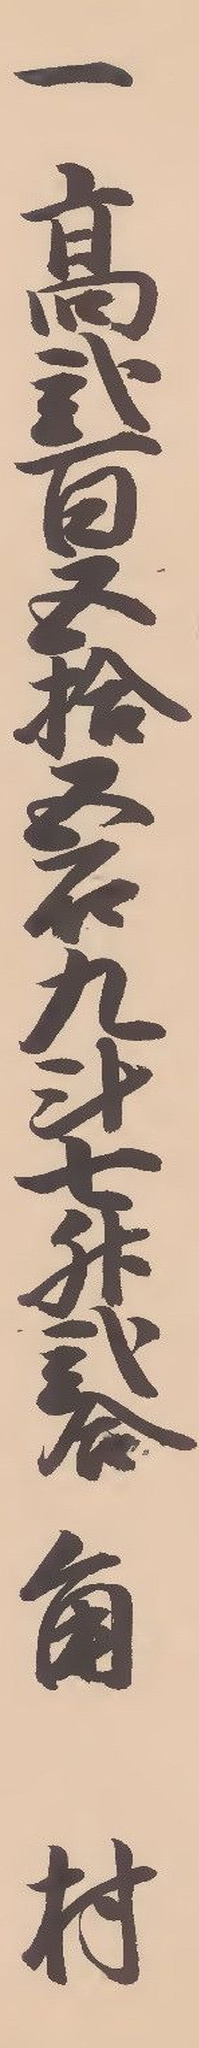一高弐百五拾五石九斗七升弐合角村
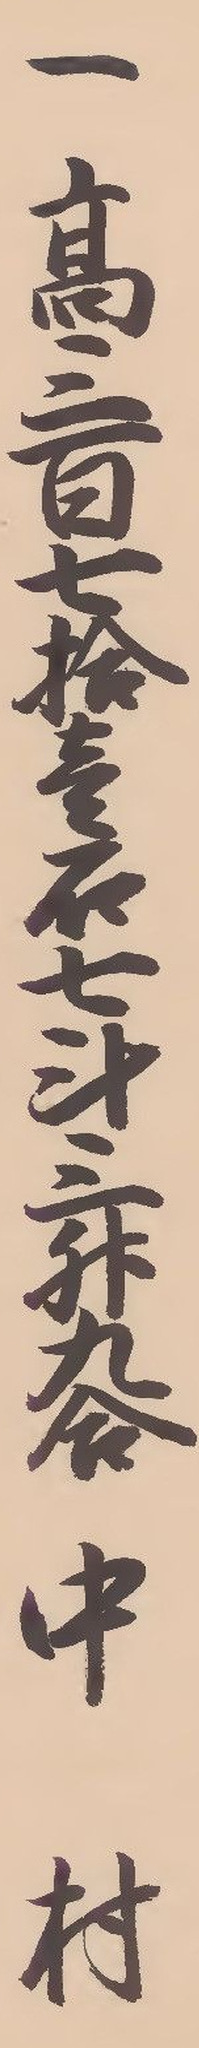一高三百七拾壱石七斗三升九合中村

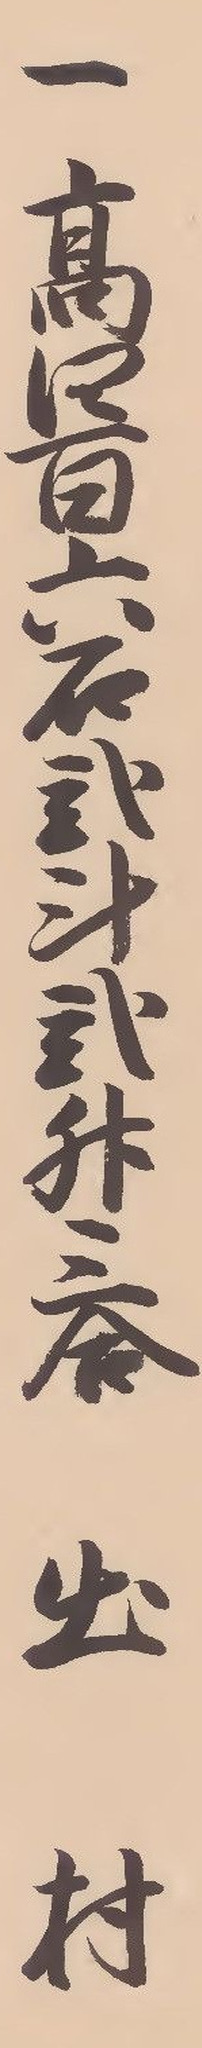一高四百六石弐斗弐升三合出村
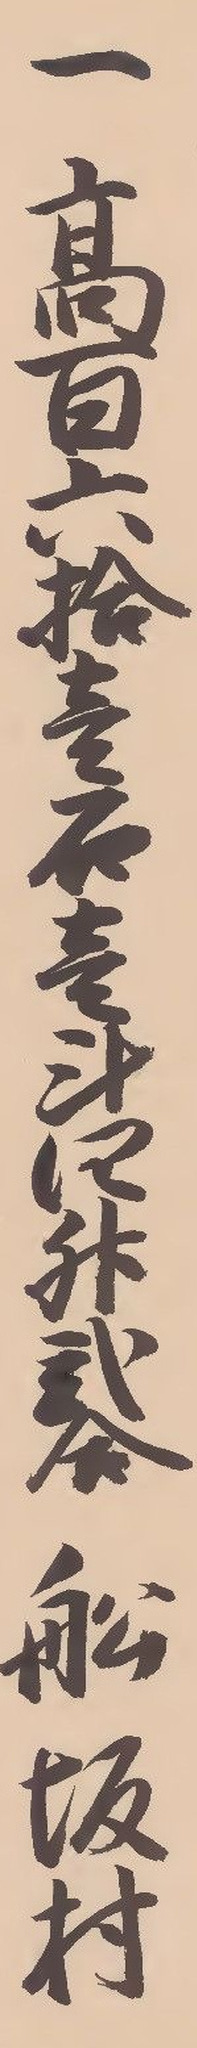一高百六拾壱石壱斗四升弐合船坂村
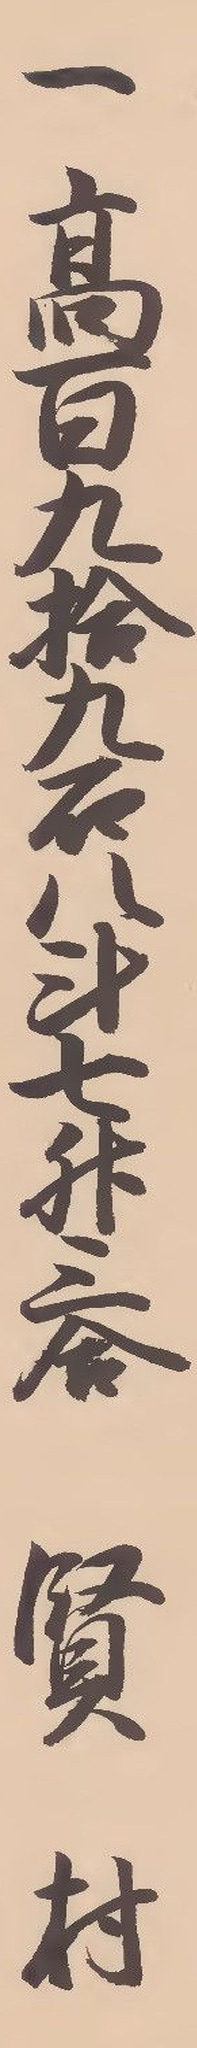一高百九拾九石八斗七升三合賢村
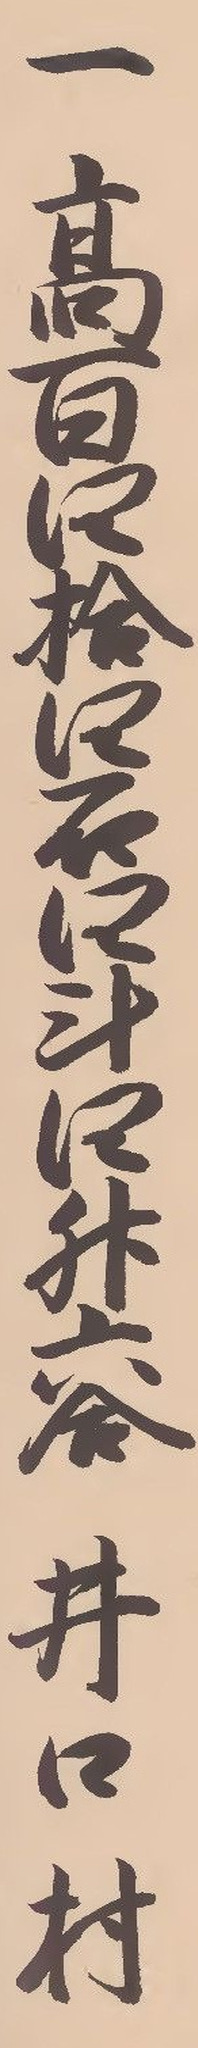一高百四拾四石四斗四升六合井口村
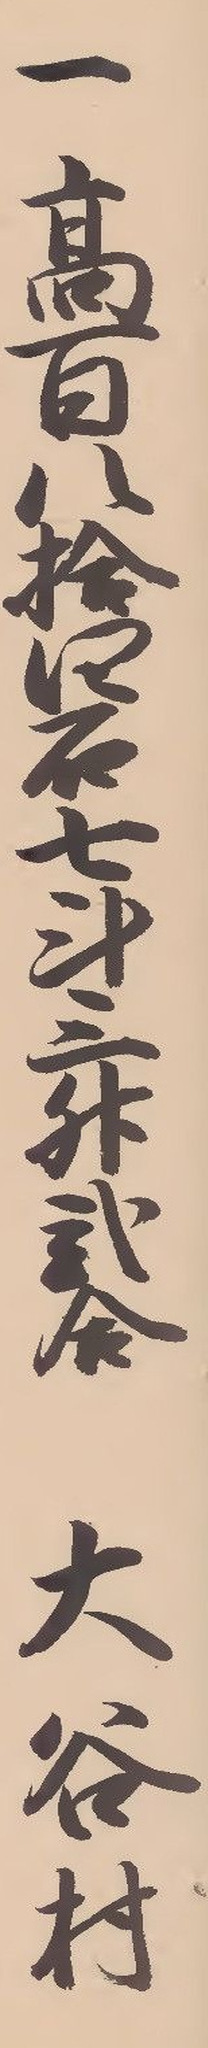一高百八拾四石七斗三升弐合大谷村
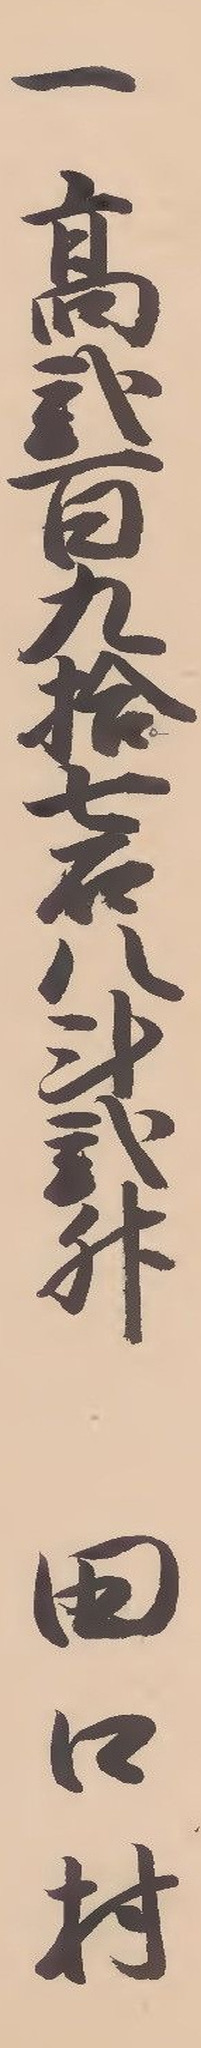一高弐百九拾七石八斗弐升田口村
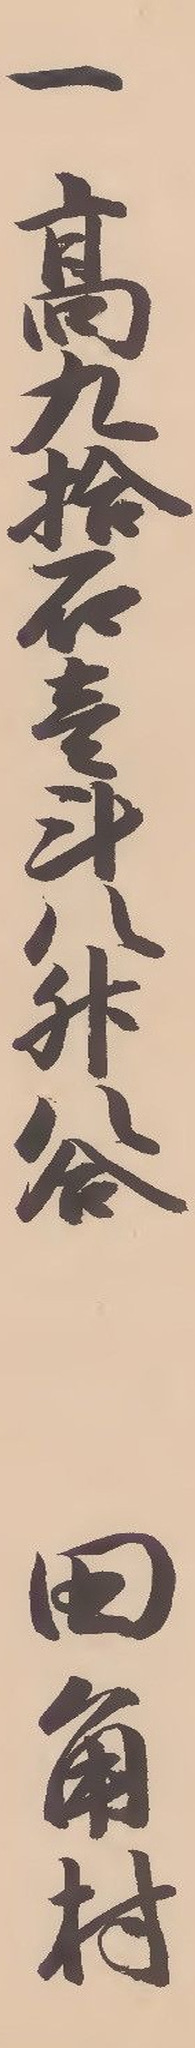一高九拾石壱斗八升八合田角村

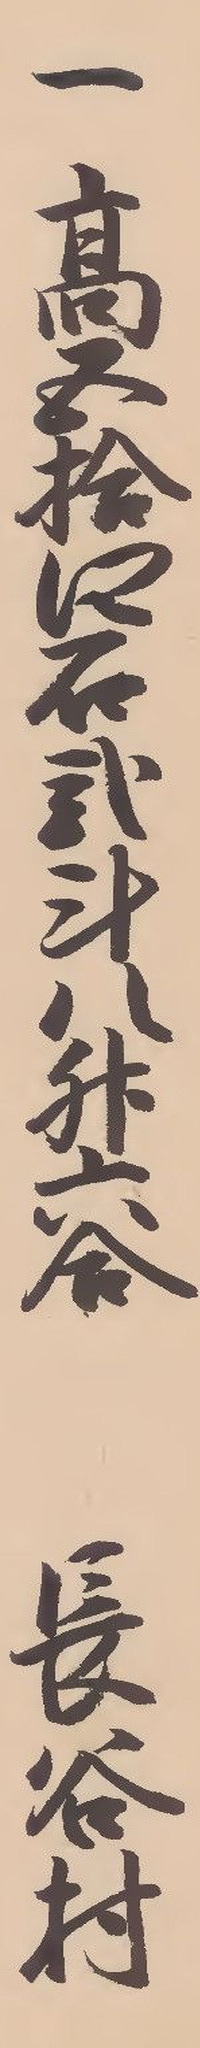一高五拾四石弐斗八升六合長谷村
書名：紀伊国郷帳
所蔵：国立公文書館 National Archives of Japan
